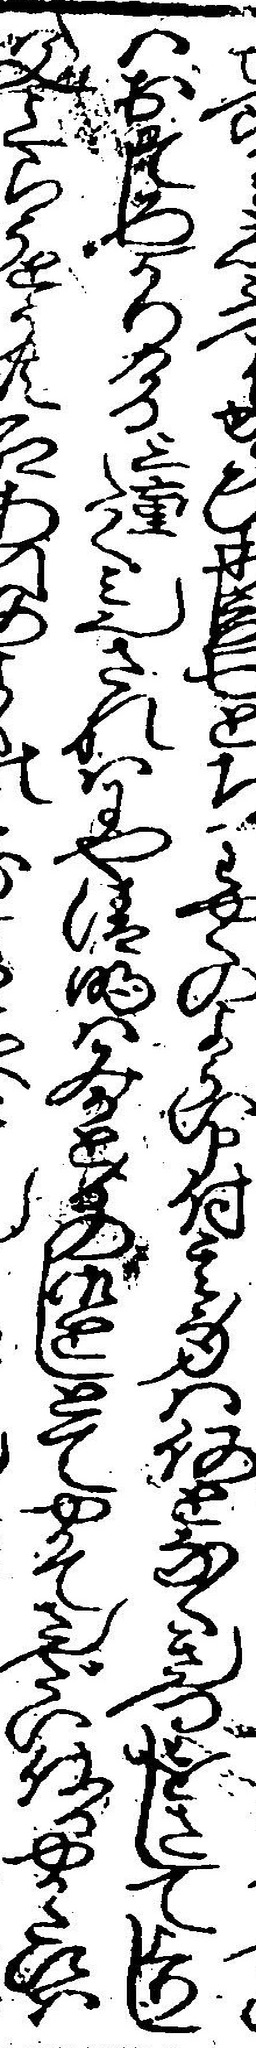はおそろしかりける三重たくみ也されはにや清明はみかとゟの御としとてやがてさんだい仕るやかたには
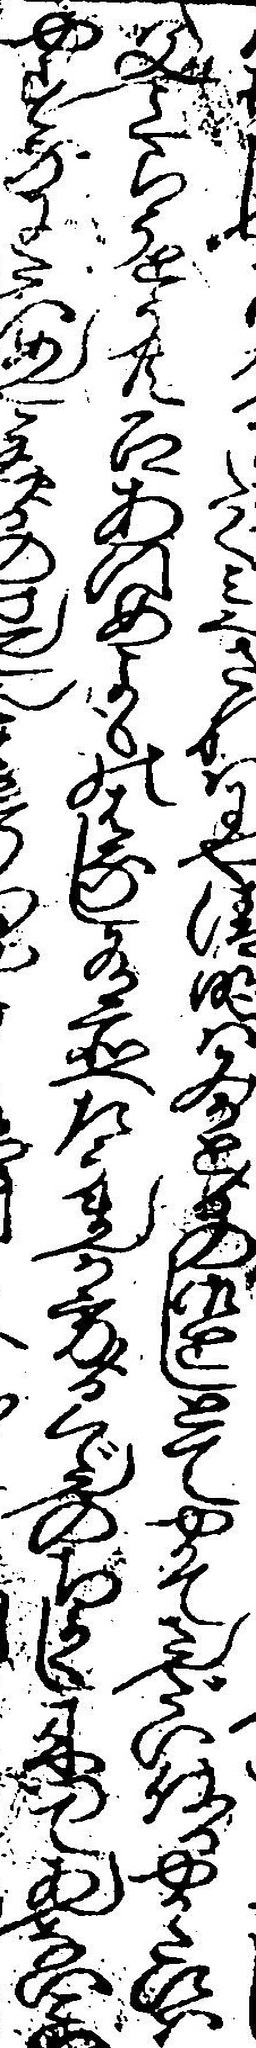父上らうとう共召しあつめよものはなし有所へたうまんか方ゟくだんのちよくし来つてあんないこい
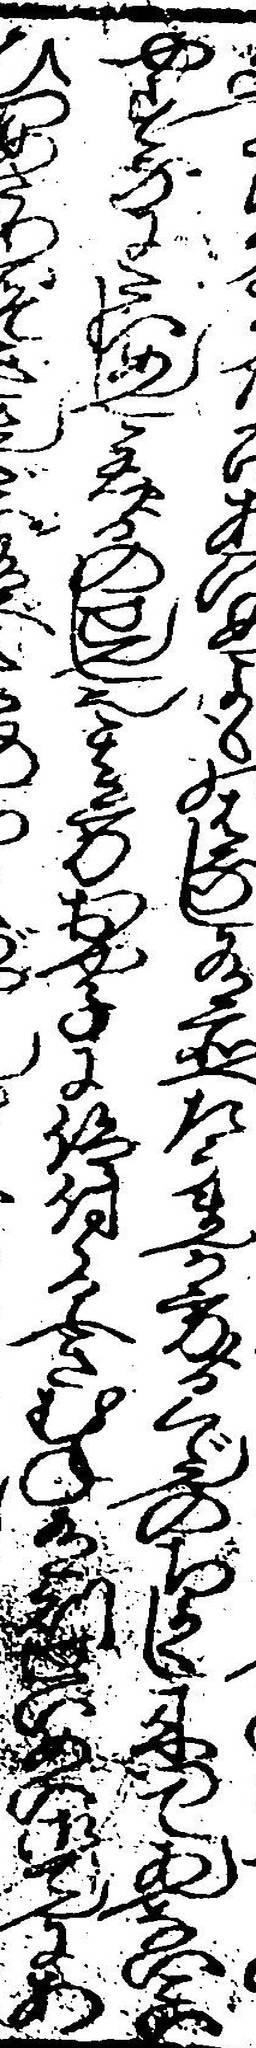やすなにたいめんし君ゟのせんし也其方おや子に仰付らるへきむね有則せいめい御てんにあ
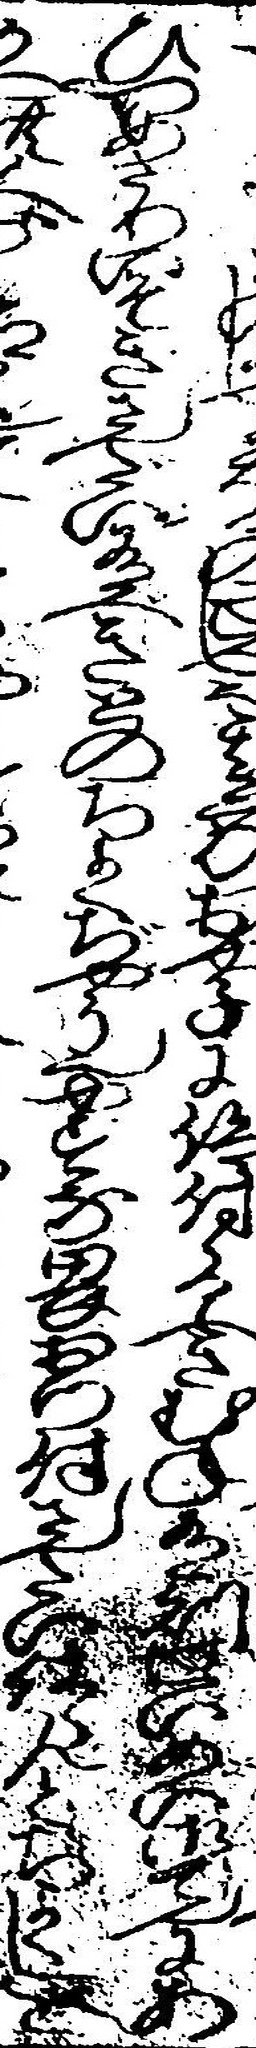ひつめたりいそきさんだい有へきとのちよくぢやう也やすな畏おつ付さんたい仕らんとちよくしを
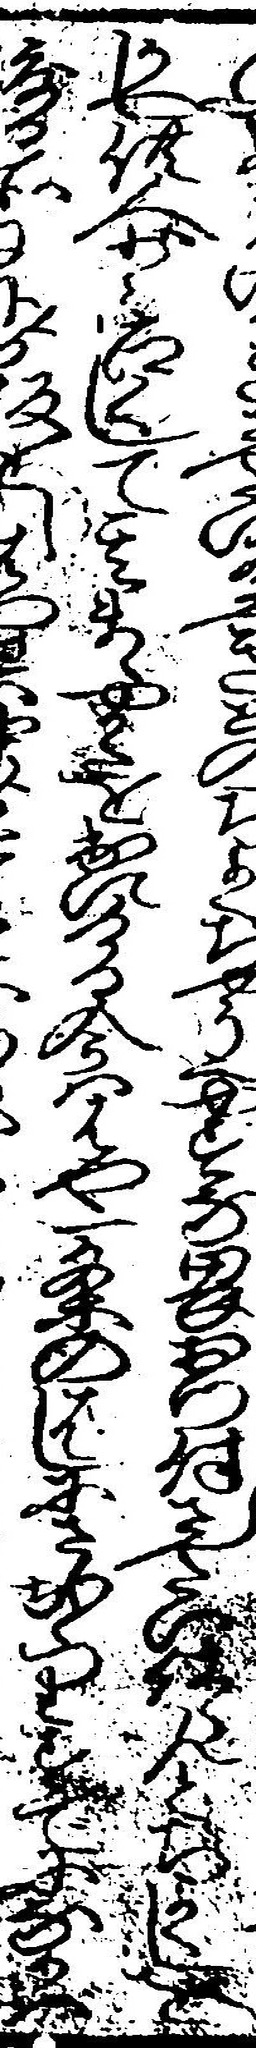かへし供人少々召くして其まゝやかたを出にける今ははや一条のはしにさしかゝりすでになかば
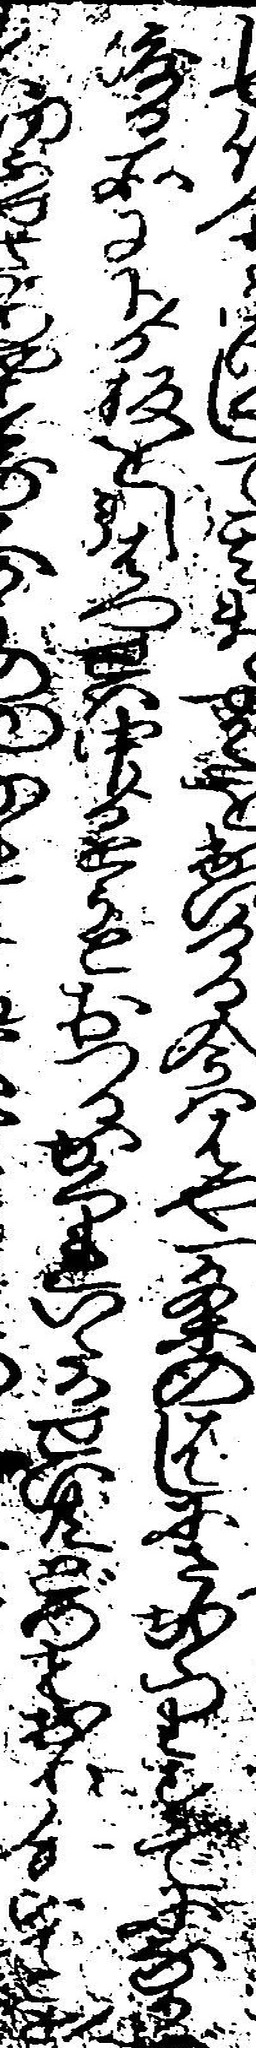渡る所に下ゟ板を引はつせは中よりとうとおつるかくれいたるせい共どつとおりこと〳〵

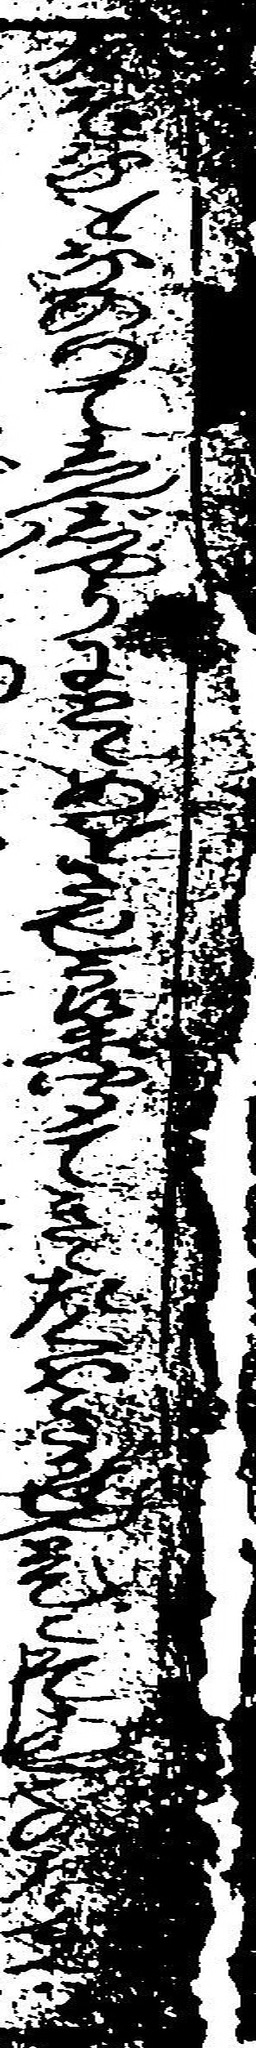成そなをなのつてしんじやうにとゝめをさせ郎等聞てきゝたくはきかせん是こそあしやのたうまん
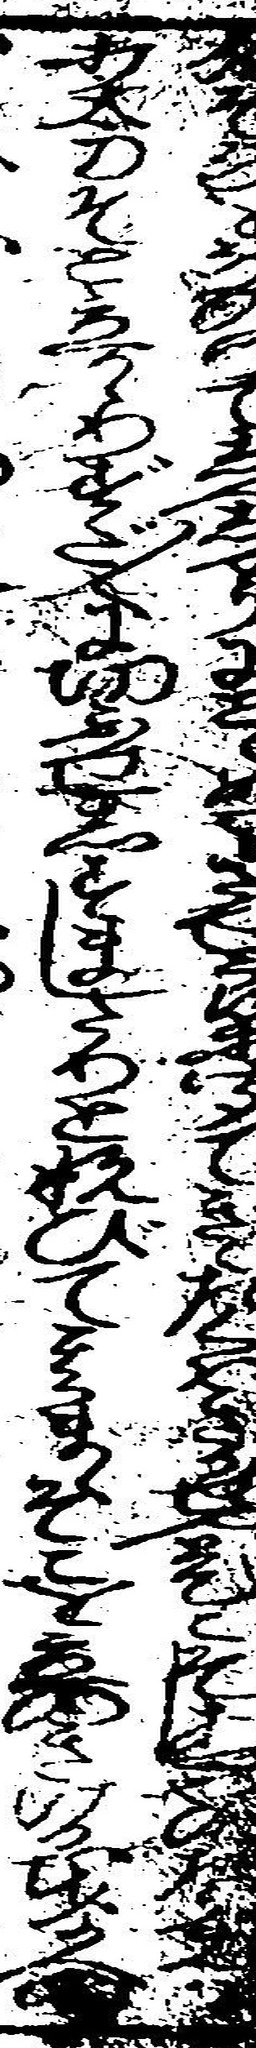打太刀そと立かゝりずだ〳〵に切ふせしすましたりと悦びて其まゝそこを立のきける本ゟ人の
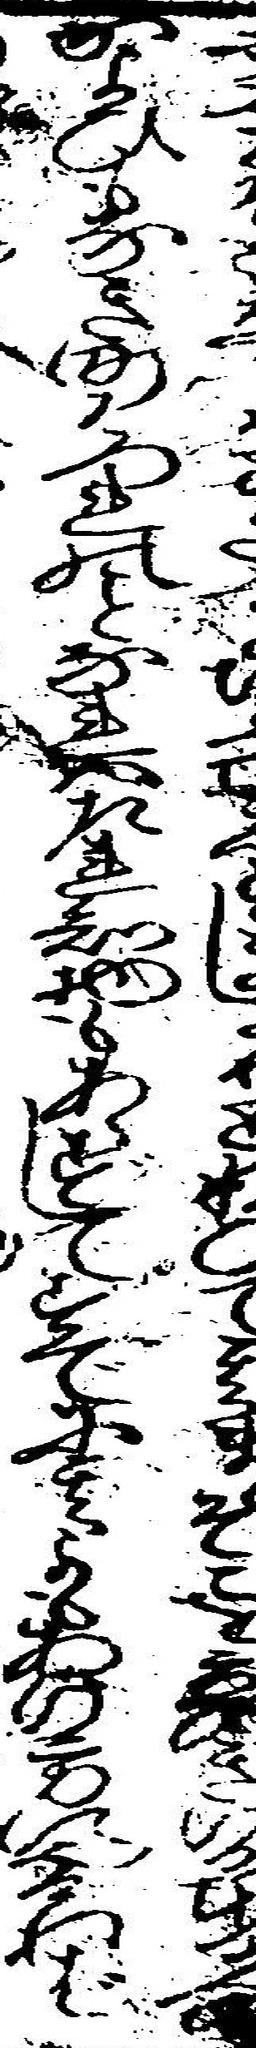かよひもなき町はつれのことなれはたれ知物もあらずしてすでに其よもあけ方に也ければ
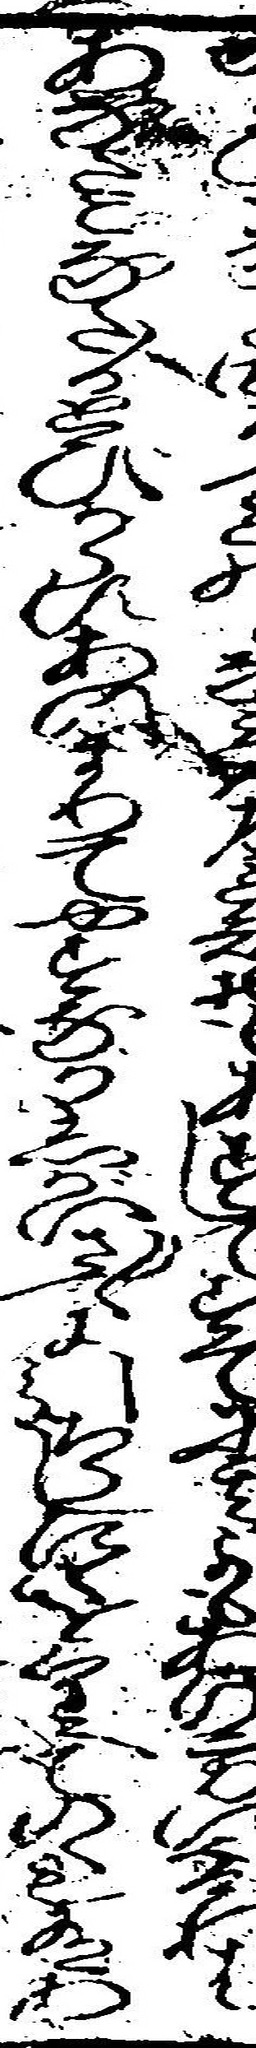あなたこなたゟとびからすあつまりてやすなかしがいさん〳〵に引ちらしにくをくわへてのくも有あ
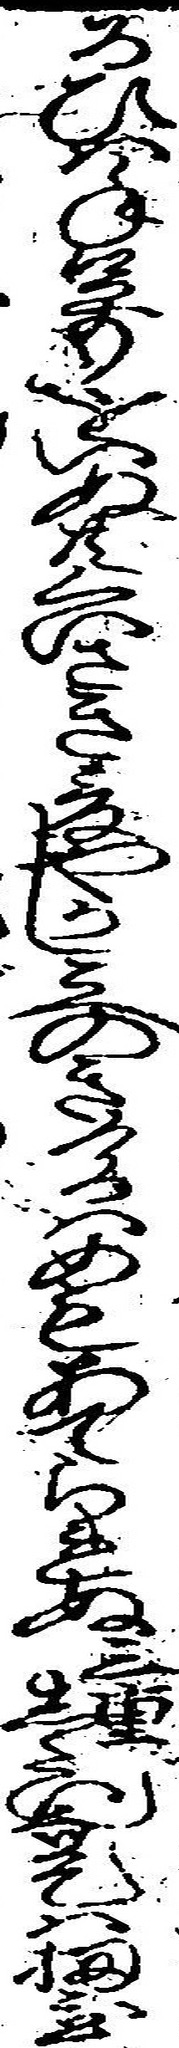るひは手足もくをいぬ共くいさき爰やかしこへのきけるはめもあてられぬ三重したい是は扨置
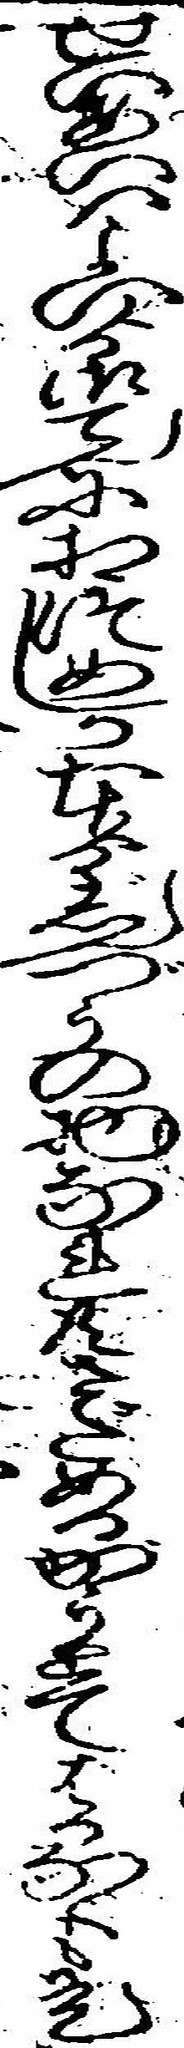せいめいよいゟ御てんに相つめしか本ゟじんづうの物なれ共さだめるかうとてはかなくも是
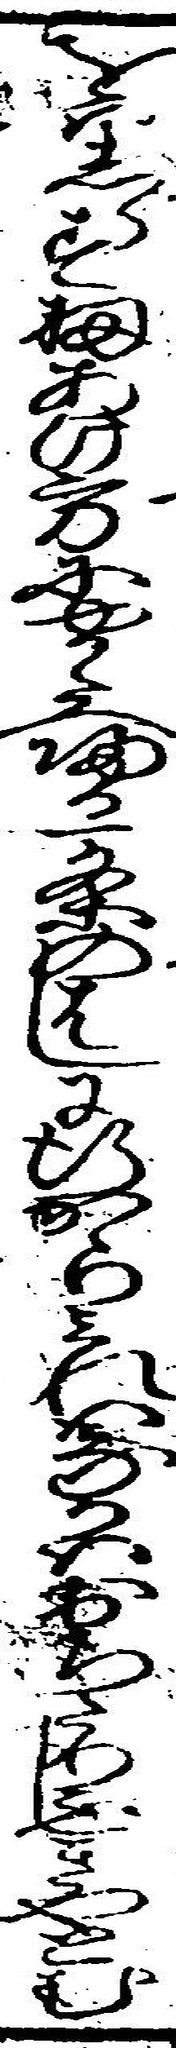をはしらす扨あけ方にやかたへ帰り一条のはしに行かゝりみれはなかはおちたりふしきやとむ
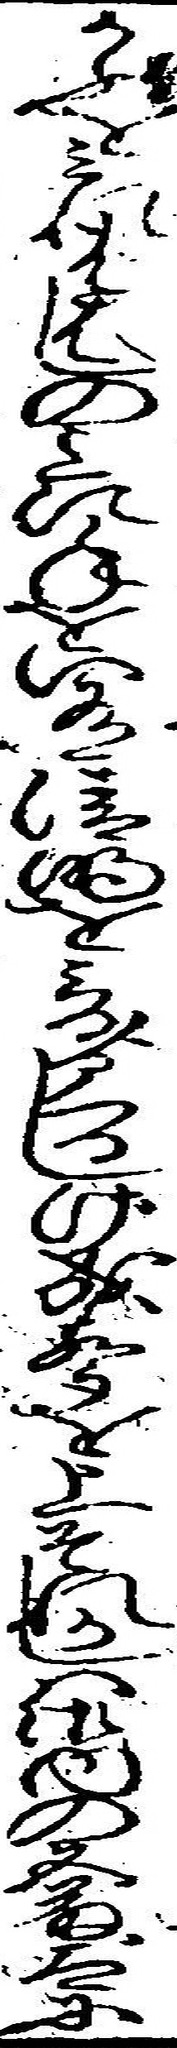かふをみればはしの上に手をい有清明をみるゟくるしげ成声を上それかしは御内の五藤太に
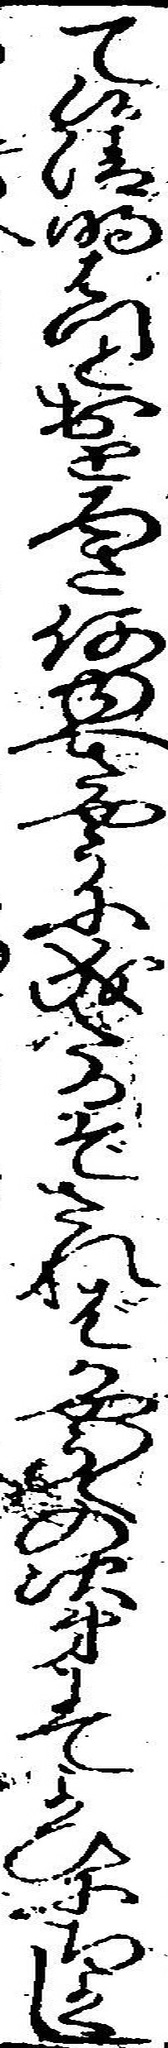て候清明はつとおとろき何ゆへさやうに成たるぞさればかやう〳〵の次第にてよひにちよくし
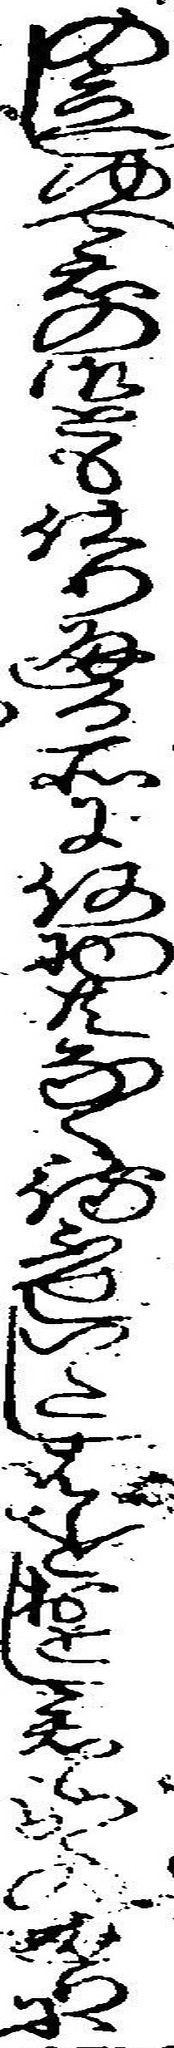の立しゆへ君の恩とも仕り通る所に何物共なく侍ふせいたしはしをおとし君もかくの通？りに
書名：[しのだづまつりぎつね付あべの清明出生]
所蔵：東京大学総合図書館 General Library in the University of Tokyo, JAPAN
